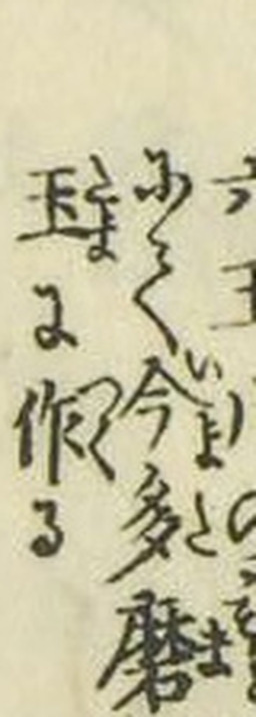玉に作る
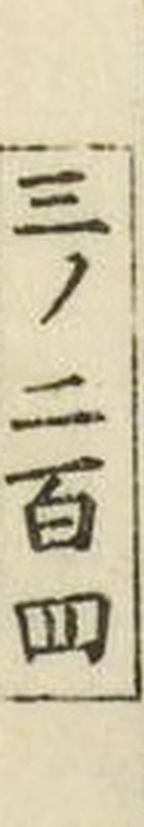三ノ二百四

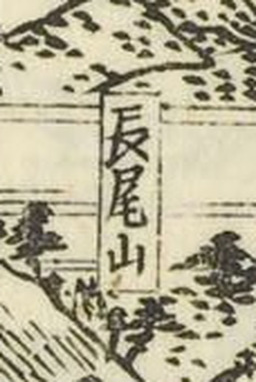長尾山
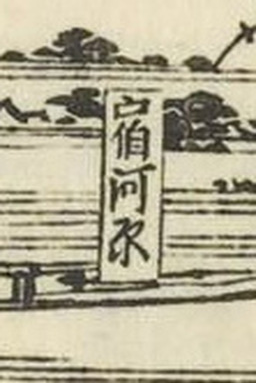宿河原
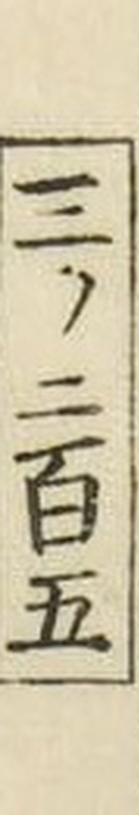三ノ二百五
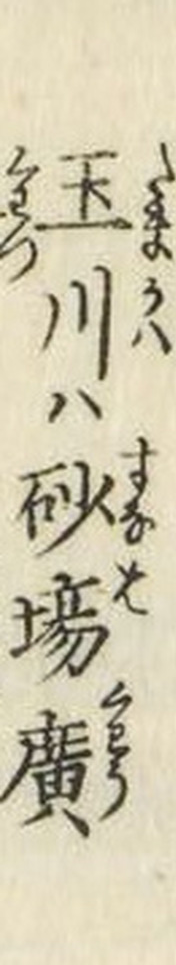玉川は砂場広
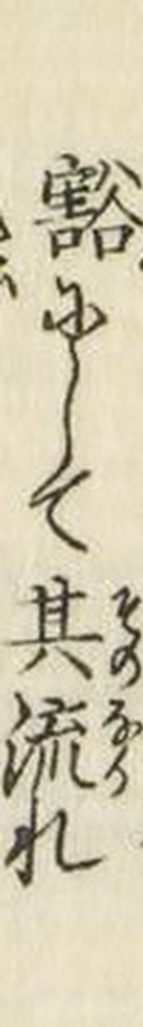豁にして其流れ
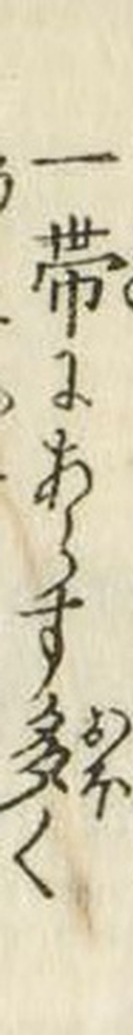一帯にあらす多く
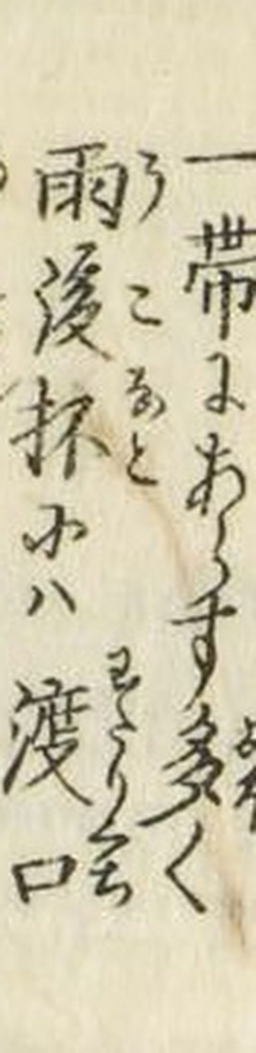雨後抔には渡口
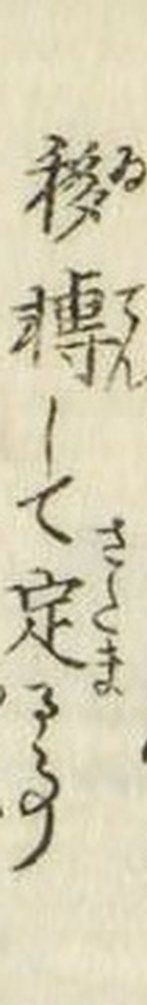移転して定る事
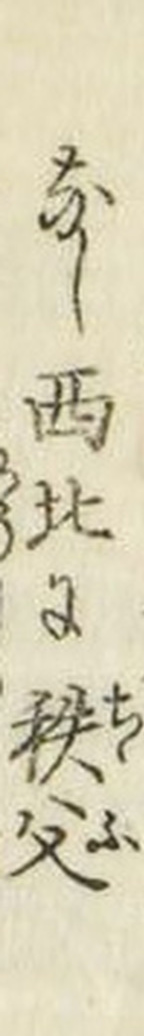なし西北に秩父
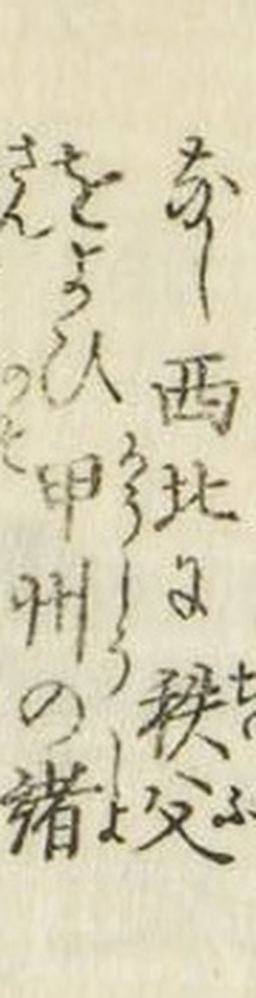をよひ甲州の緒
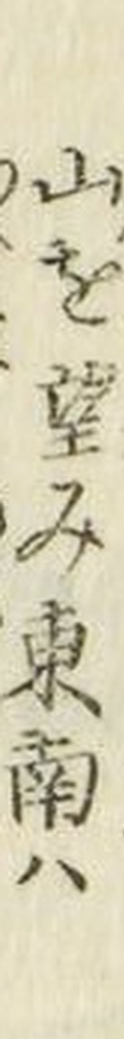山を望み東南は
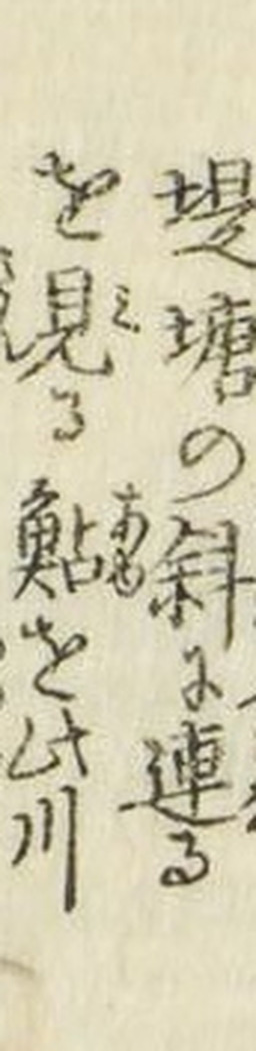を見る鮎を此川
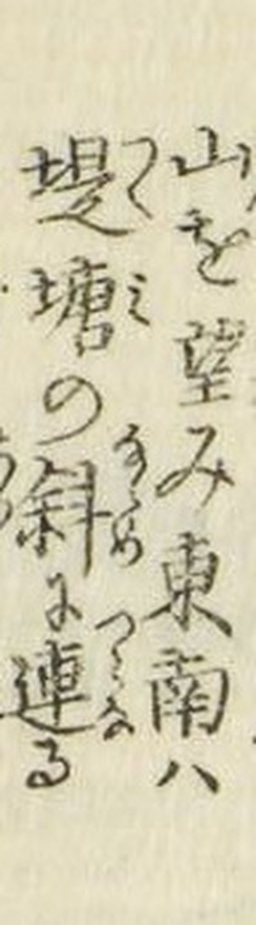堤塘の斜に連る
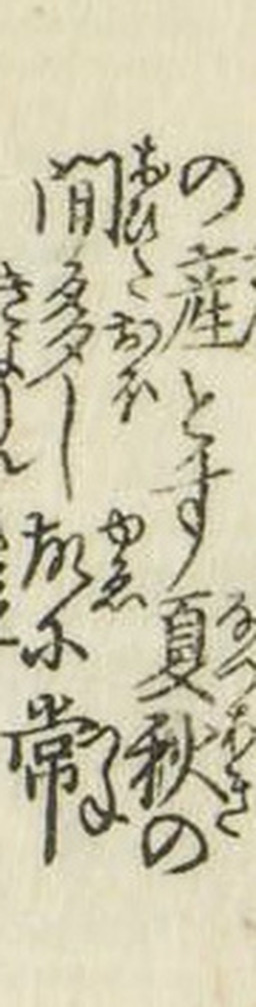間多し故に常
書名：江戸名所図会 20巻 巻之10
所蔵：東京学芸大学教育コンテンツアーカイブ
